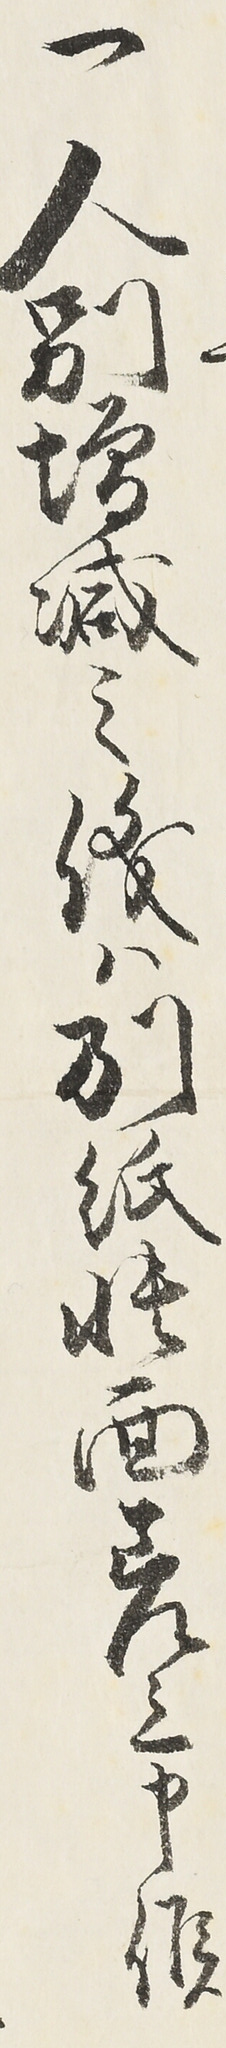一人別増減之儀ハ別紙帳面差上申候
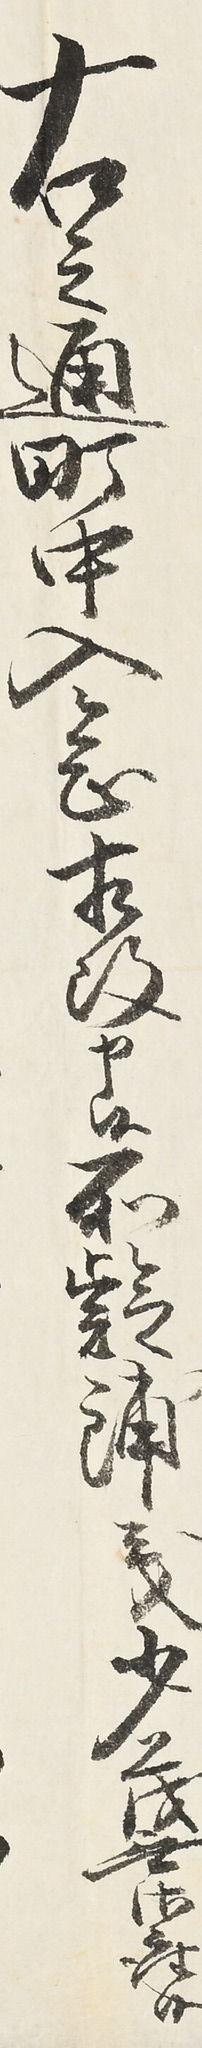右之通町中入念相改申候所疑鋪義少茂無御座候
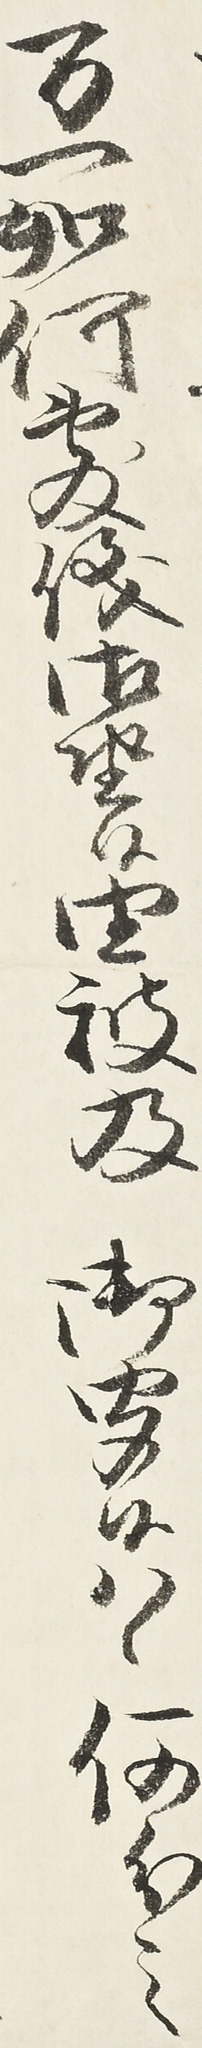万一如何敷儀御座候由被及御聞候ハゝ何分之
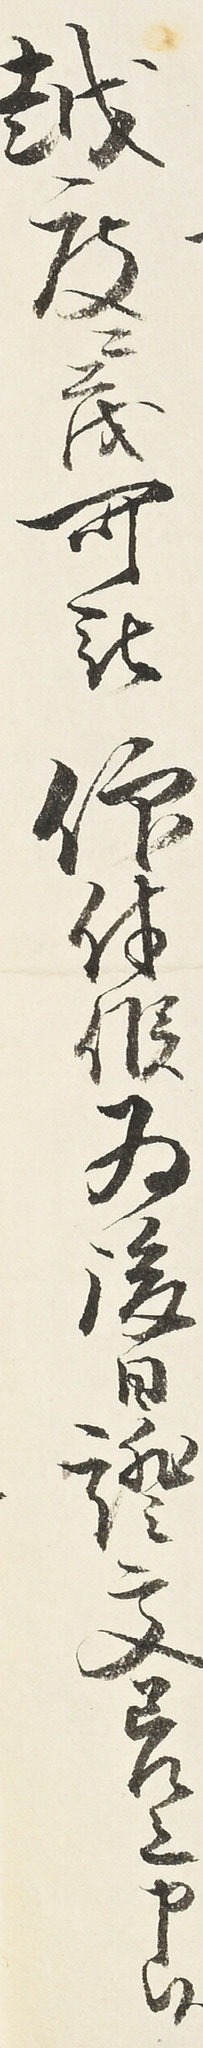越度ニ茂可被仰付候為後日証文差上申候
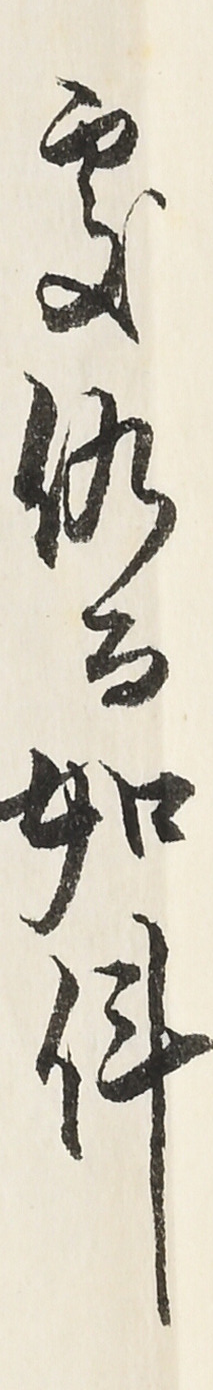処仍而如件
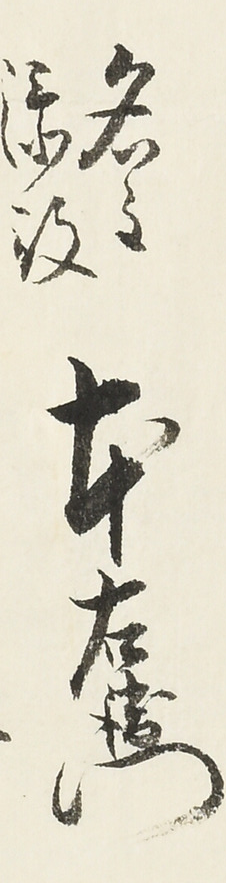添役本右衛門
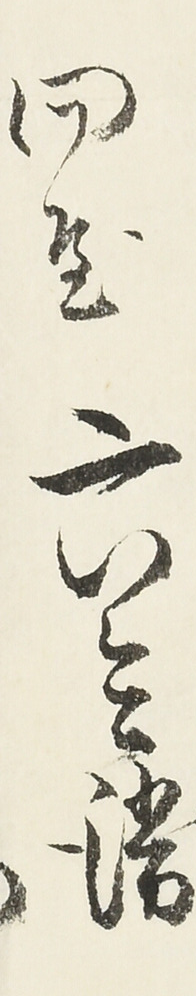問屋六兵衛
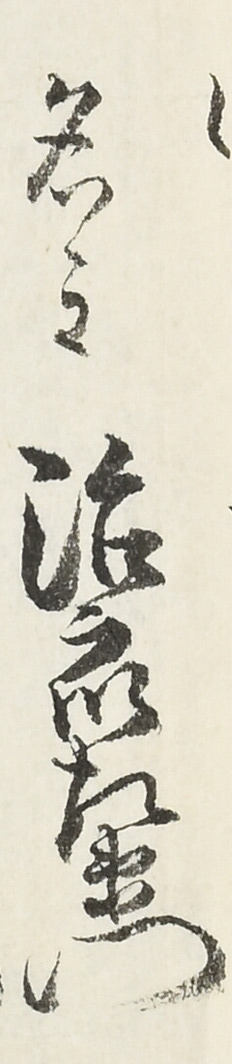名主治郎左衛門
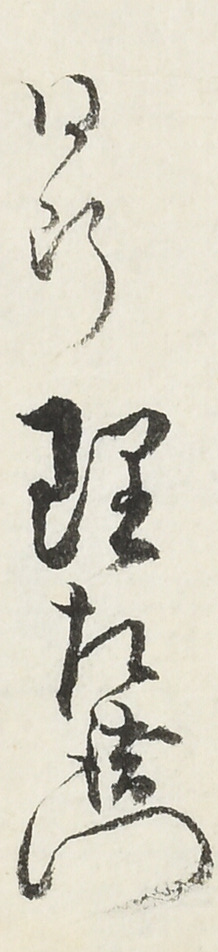同断理左衛門
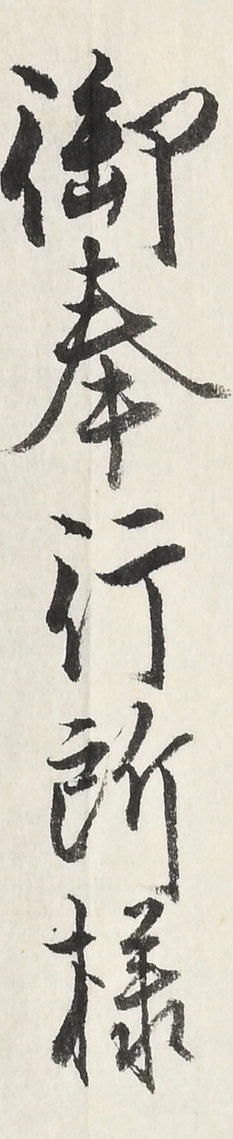御奉行所様

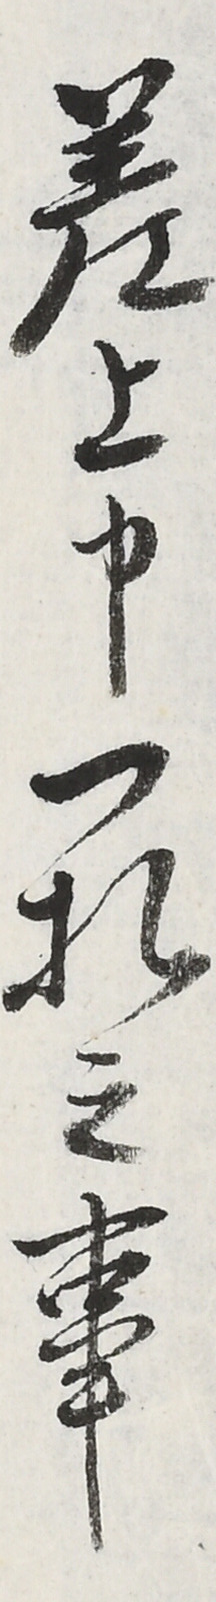差上申一札之事
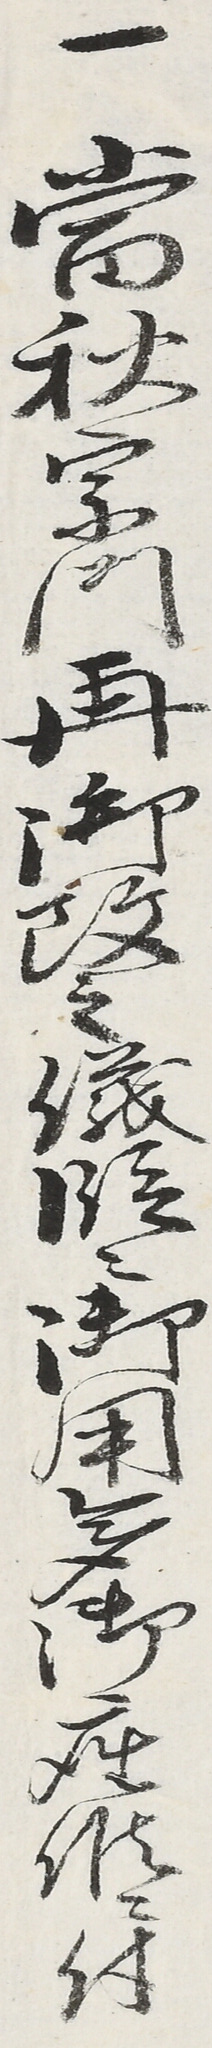一当秋宗門再御改之儀段々御用多御座候ニ付
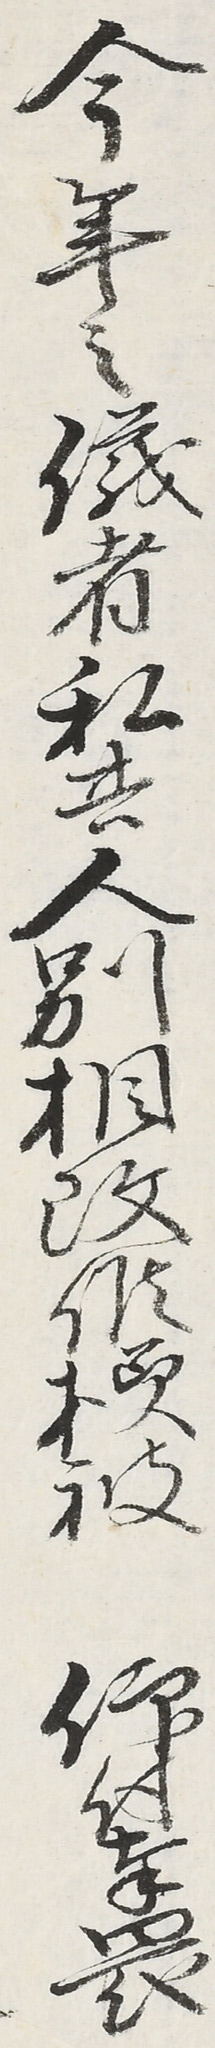今年之儀者私共人別相改候様被仰付奉畏
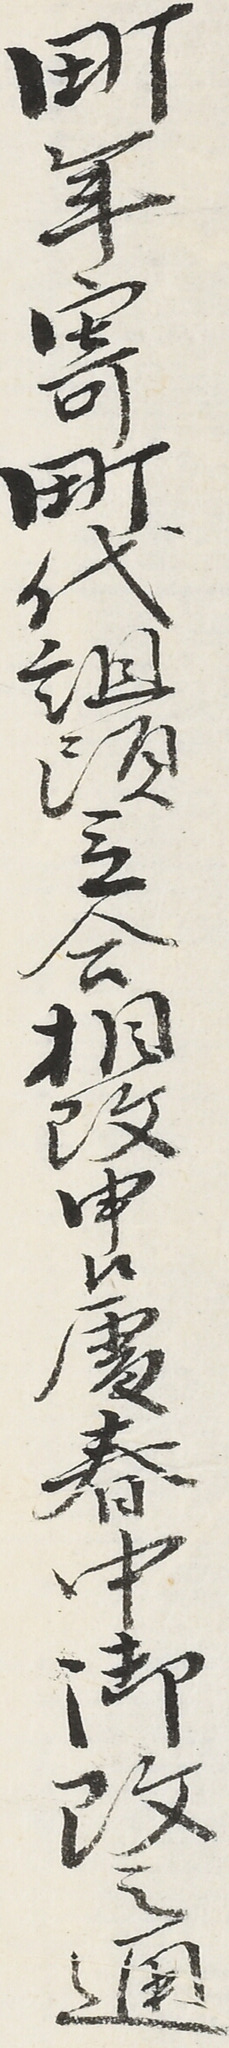町年寄町代組頭立合相改申候処春中御改之通
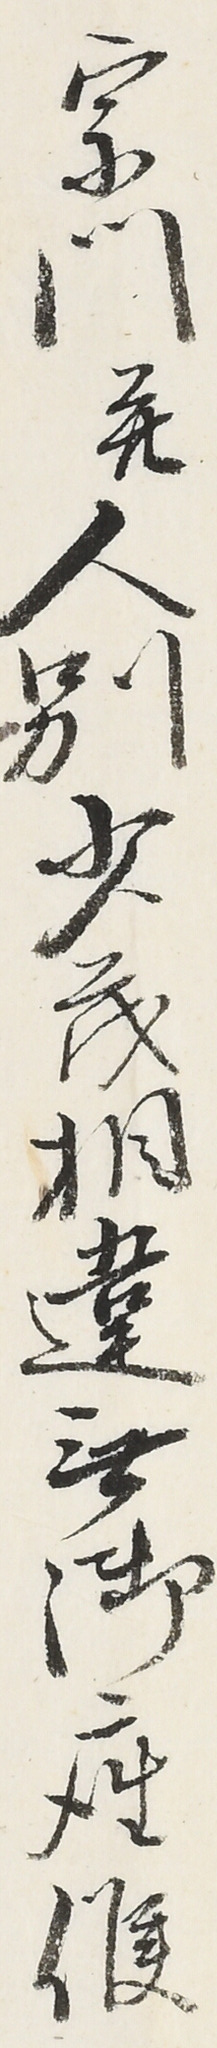宗門幷人別少茂相違無御座候
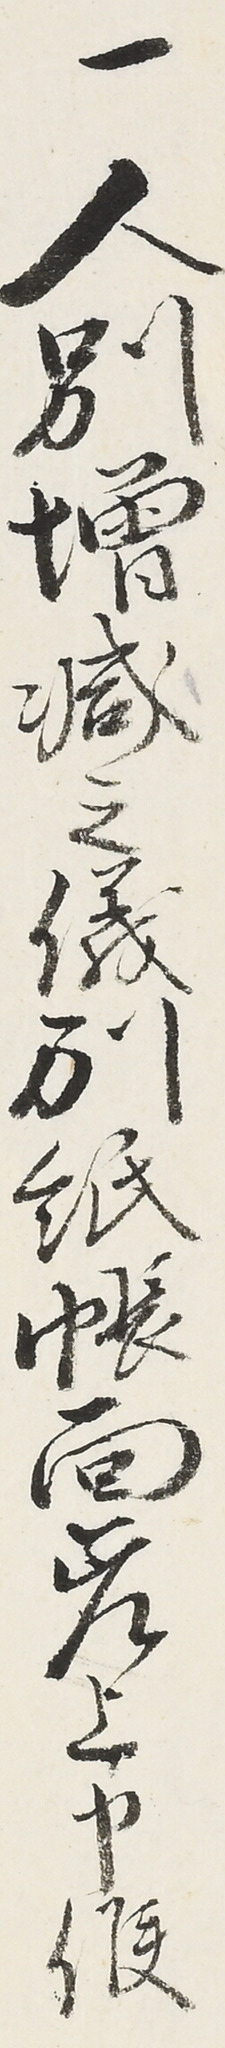一人別増減之儀別紙帳面差上申候
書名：差上申一札之事
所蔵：伊那市立高遠町図書館・合同会社AMANE
